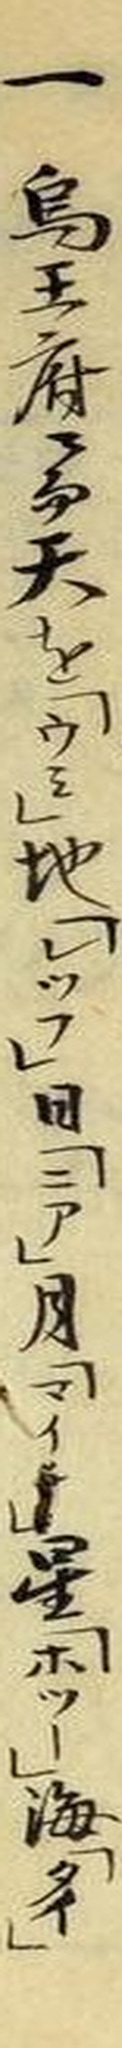一島王府ニ而天を「ウミ」地「レツフ」目「ニア」月「マイ」星「ホツー」海「タイ」
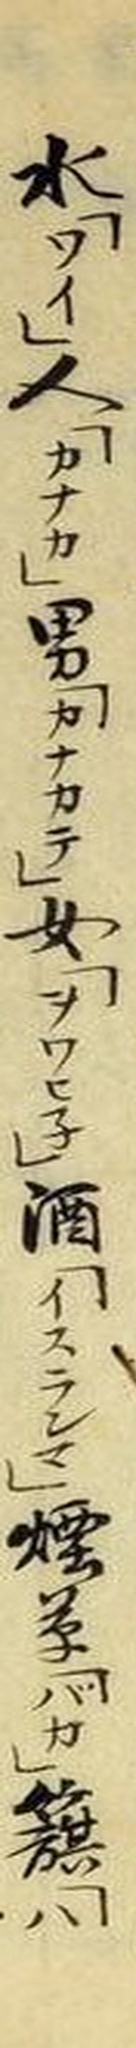水「ワイ」人「カナカ」男「カナカテ」女「ヲワヒネ」酒「イスランマ」煙草「バカ」籏「ハ「
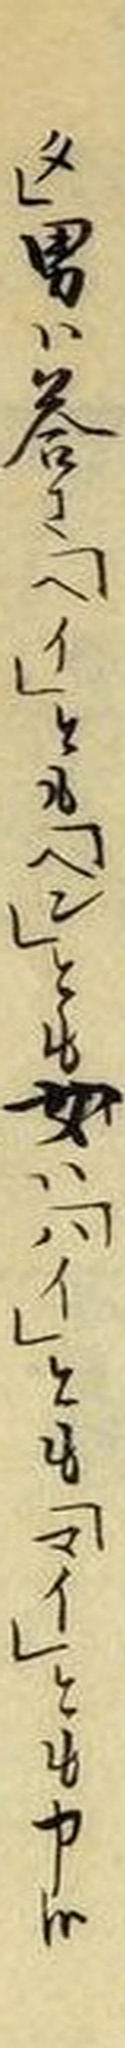タ」男ハ答に「ヘイ」とも「ヘン」とも女ハ「ハイ」とも「マイ」とも申候
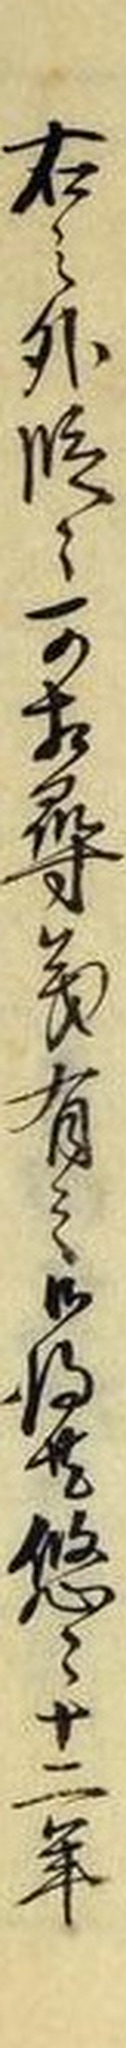右之外段々可相尋義有之候得共悠々十二年
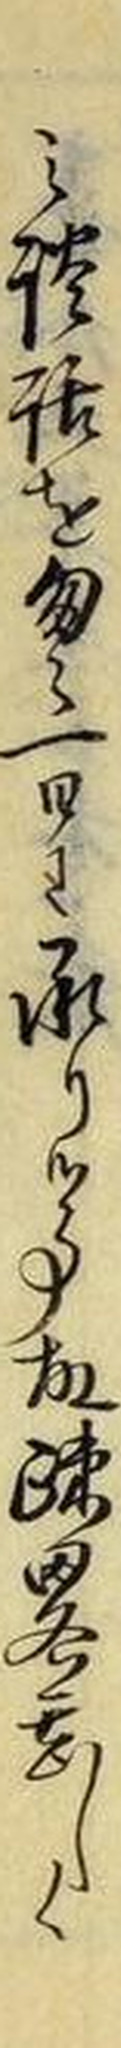之談話を怱々一日に承り候事故粗略甚しく
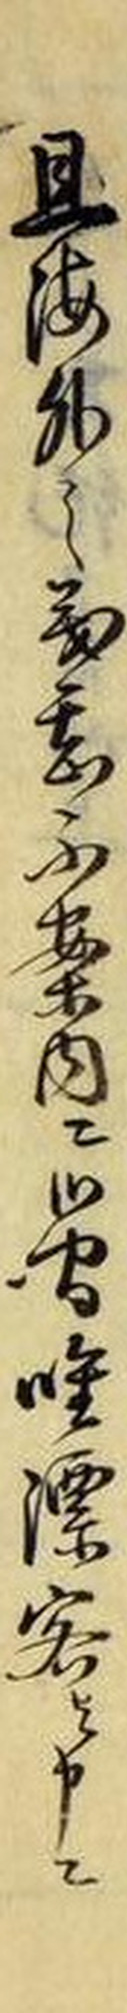且海外之義甚不案内ニ候間唯漂客与申ニ

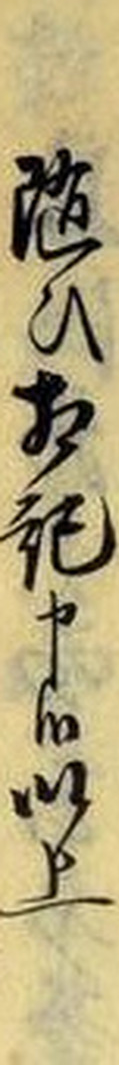随ひ相記申候以上
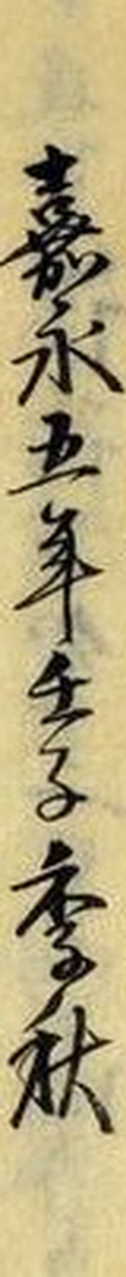嘉永五年壬子季秋
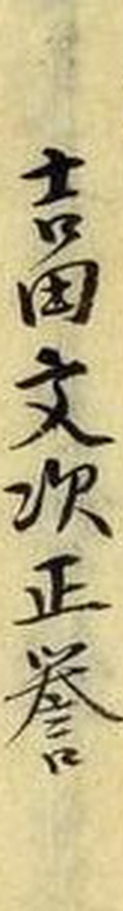吉田文次正誉

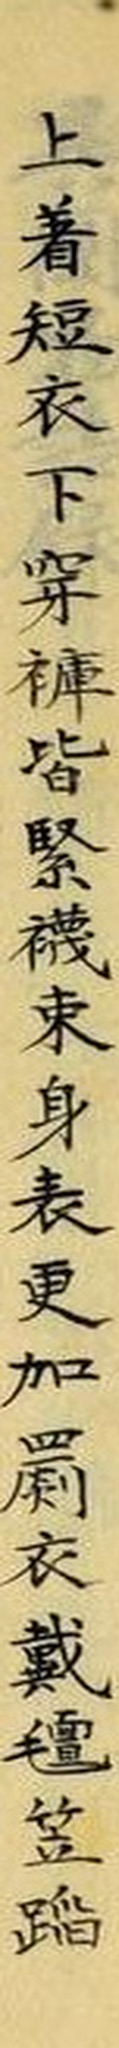上着短衣下穿袴皆緊襪足束身表更加罽衣戴氈笠蹈
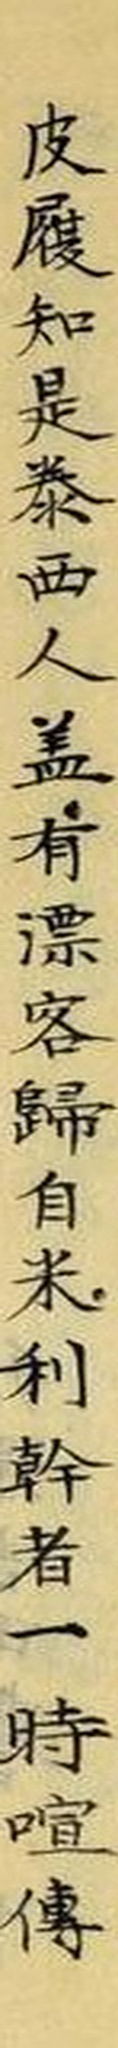皮履知是泰西人蓋有漂客帰自米利幹者一時喧伝
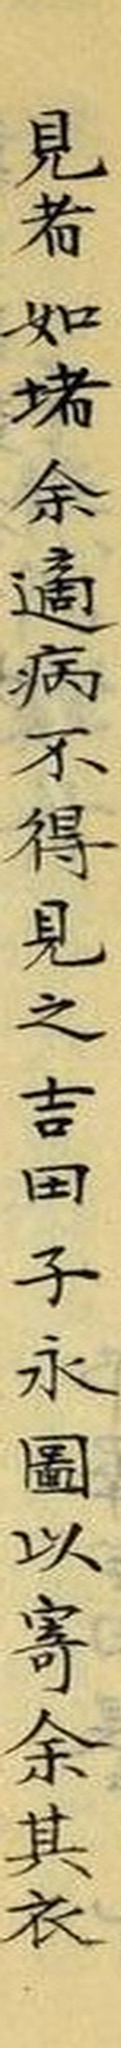見者如堵余適病不得見之吉田子永図以寄余其衣
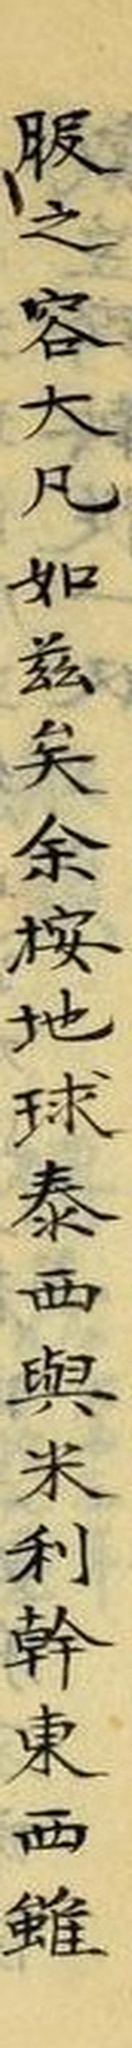服之容大凡如茲矣余按地球泰西与米利幹東西雖
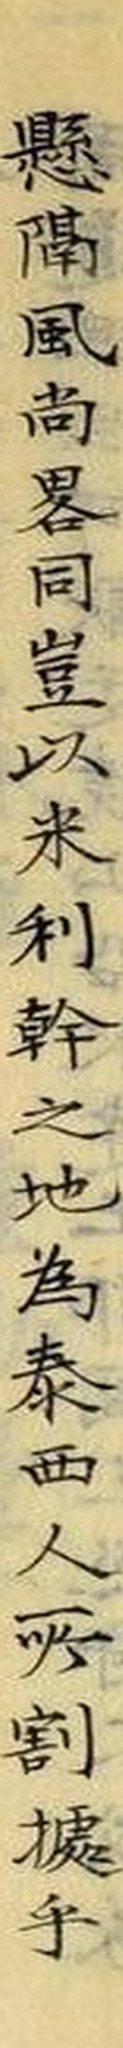懸隔風尚略同豈以米利幹之地為泰西人所割據乎
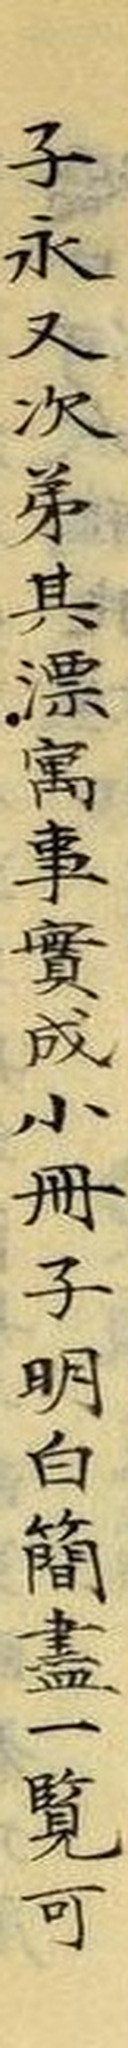子永又次第其漂寓事実也小冊子明白簡尽一覧可
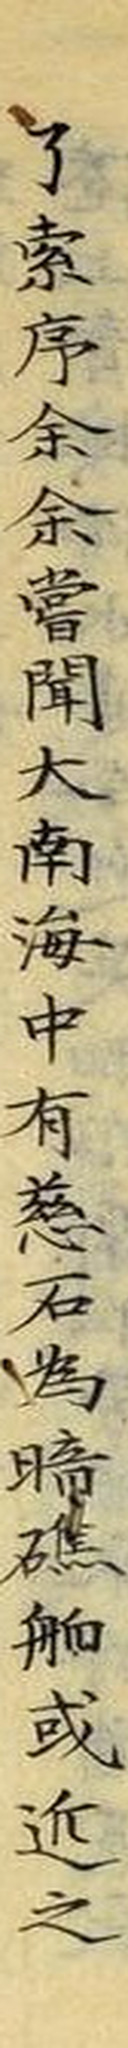了索序余余嘗聞大南海中有慈石為暗礁船或近之
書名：漂客談奇（備考雑録写8）
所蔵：福井県文書館 Fukui Prefectural Archives
